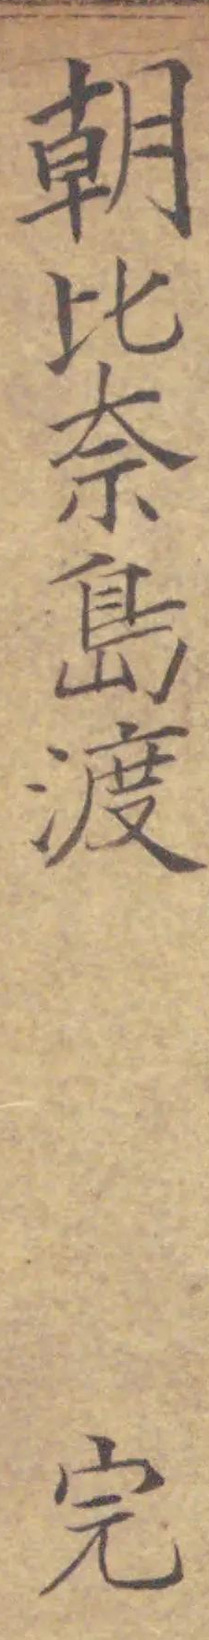朝比奈島渡完

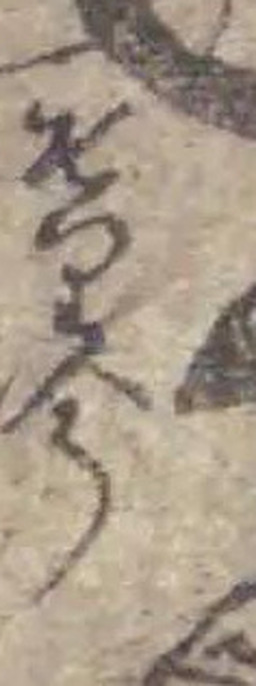そり今
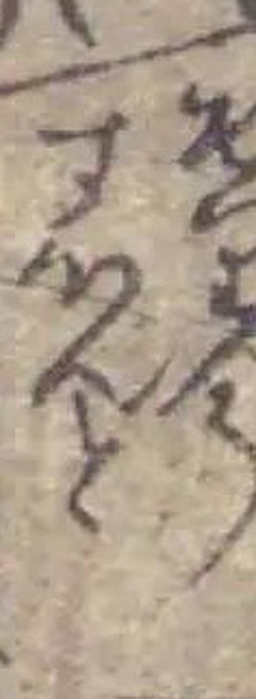すほんと
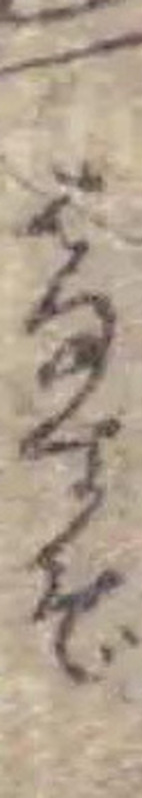はなすぞ
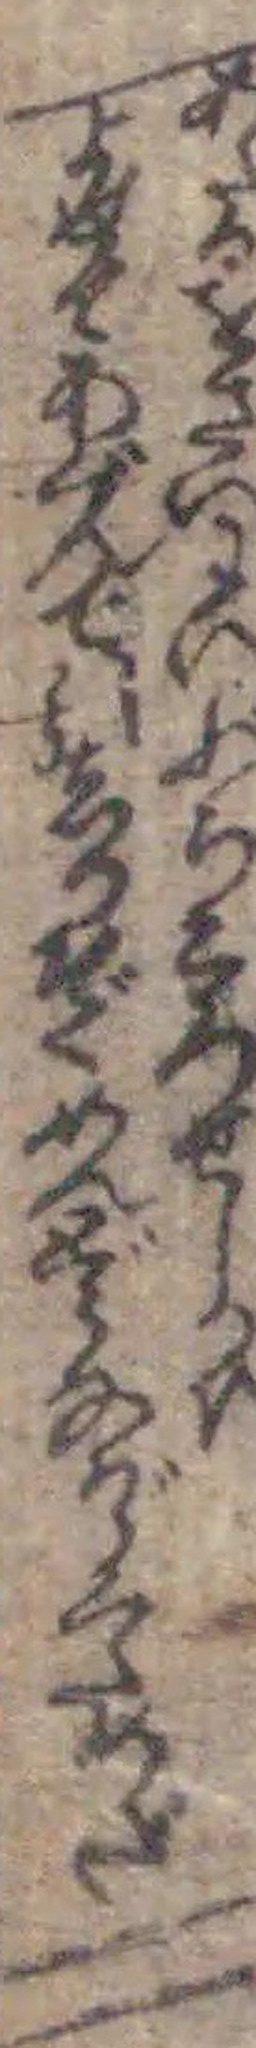よせてあぐんで引しりぞくめんどうながらくためだ

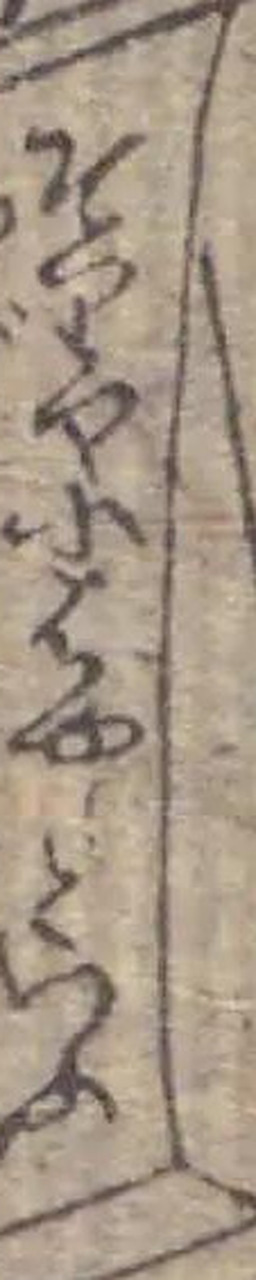そりや小ばやしといふ
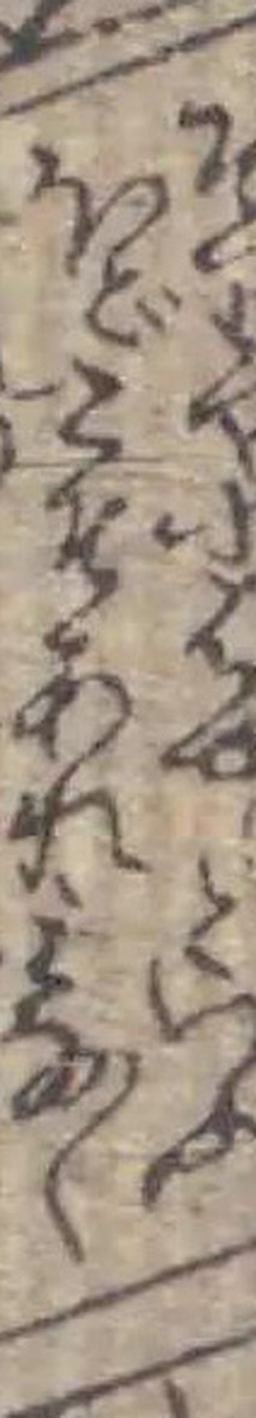ほどこそあれみな〳〵
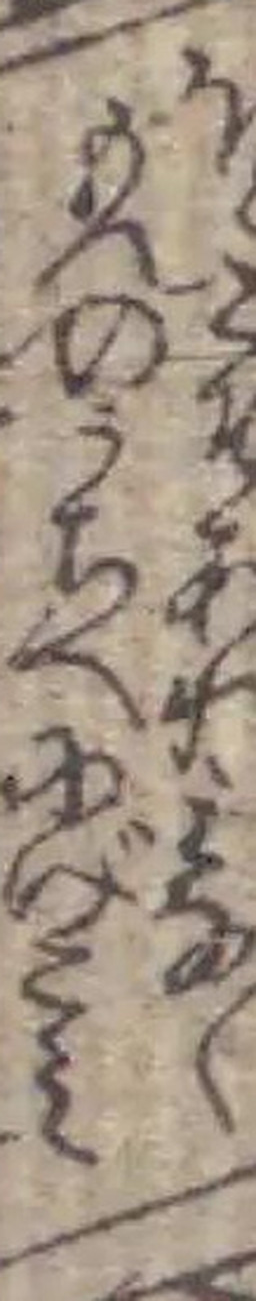もんのうちへにげこみ
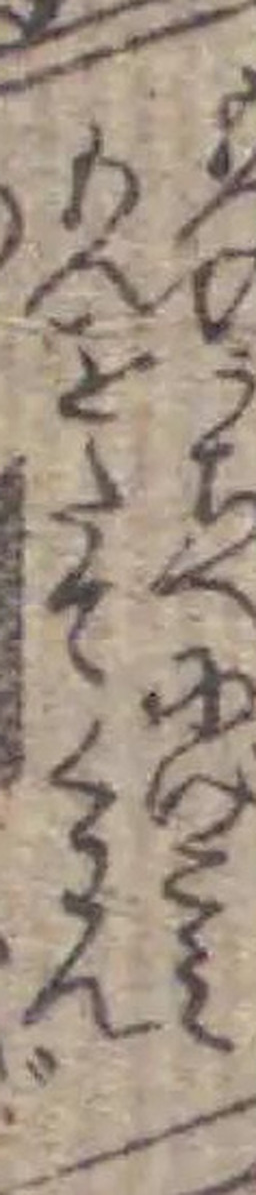もんをたてくわん
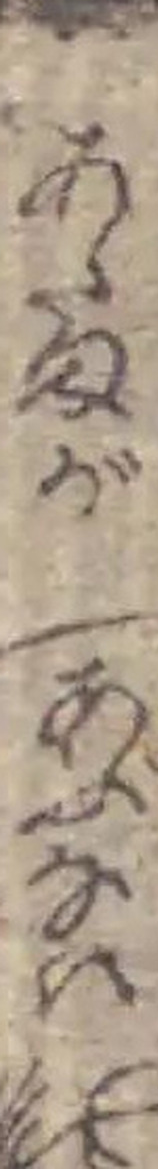あたまがあぶない
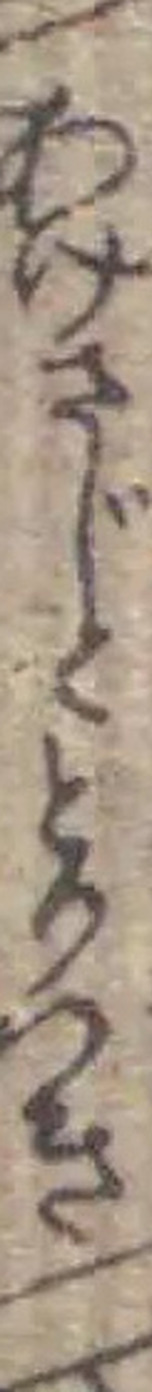あけさじととりつき
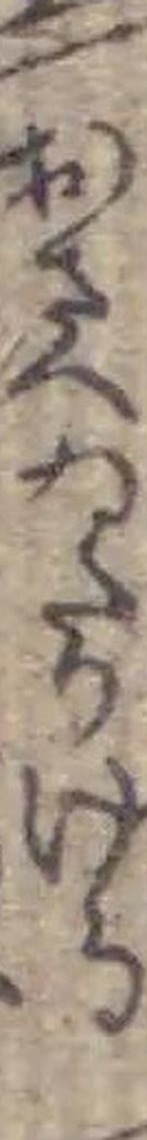おさへゐたりける
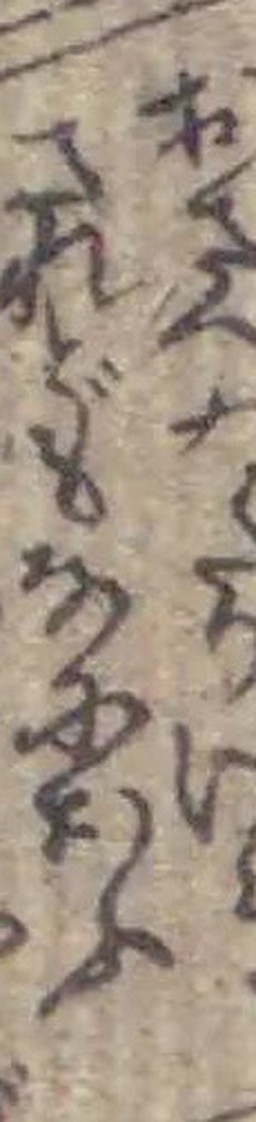されどもなにおふ
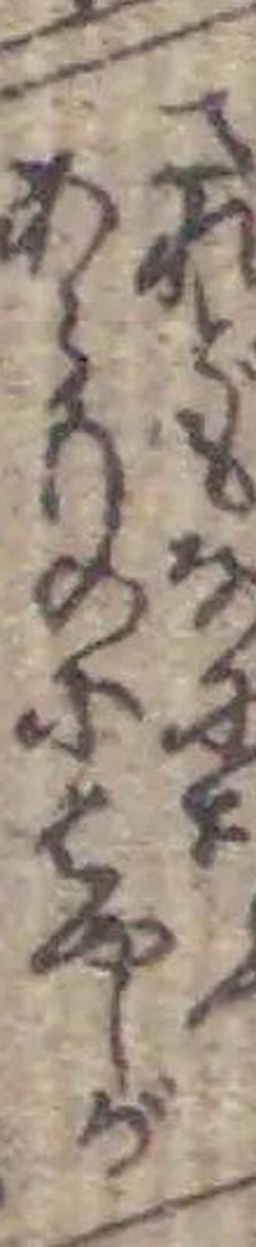あらもの小はやしが
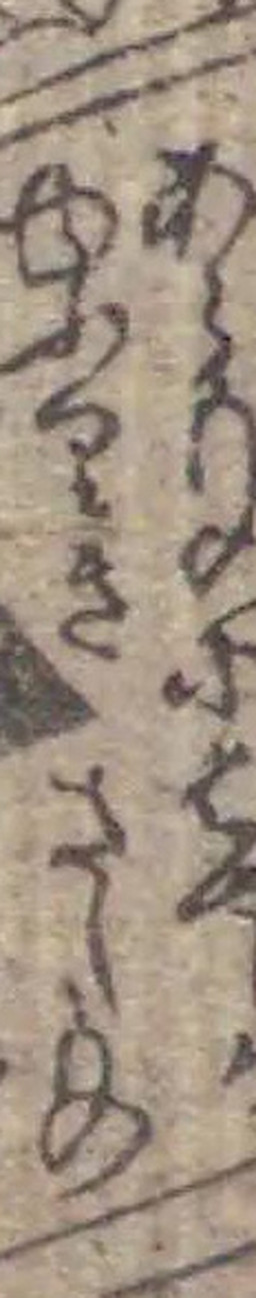ゆふりきさしもの
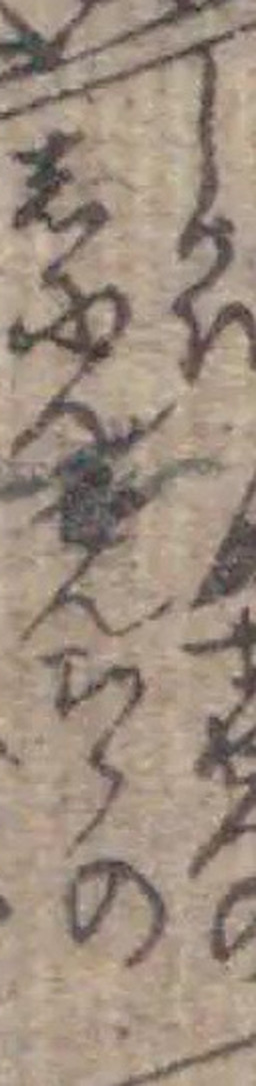しにんでんちうの
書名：朝比奈島渡 3巻
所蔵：国立国会図書館 National Diet Library, JAPAN
